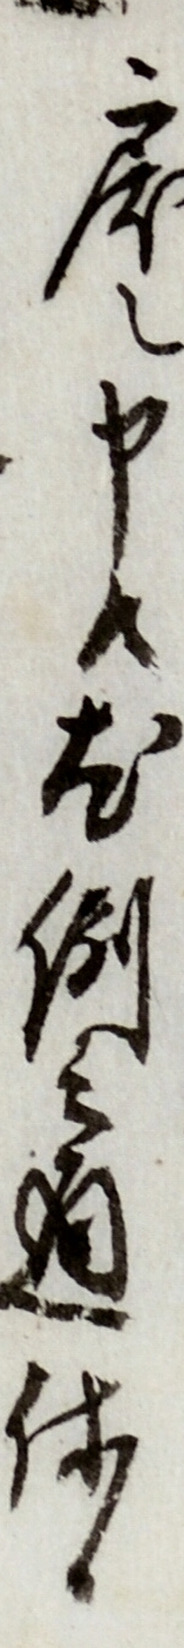戻し申候尤例之通休日
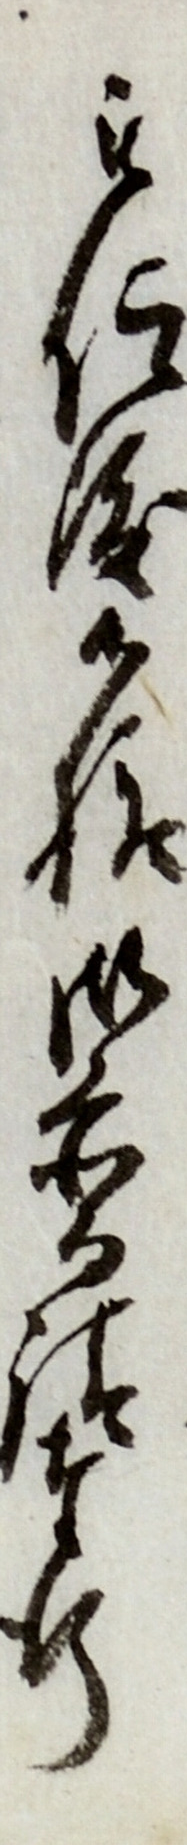被仰渡候様御普請奉行
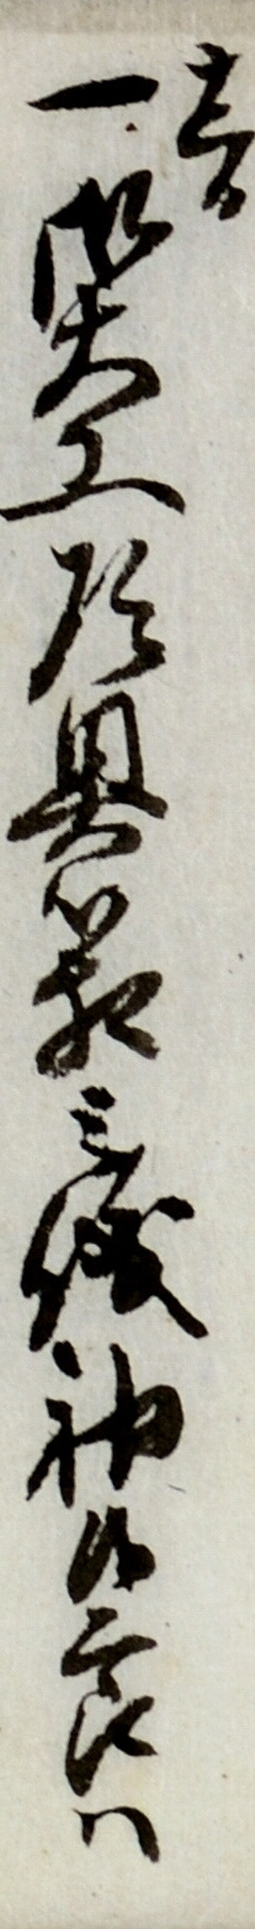一御大工道具箱之儀初候節は
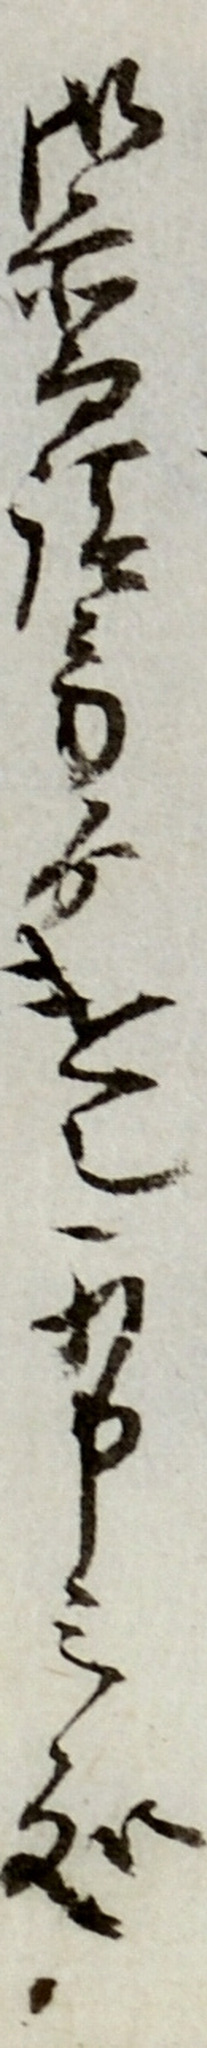御普請方より遣し承申之処
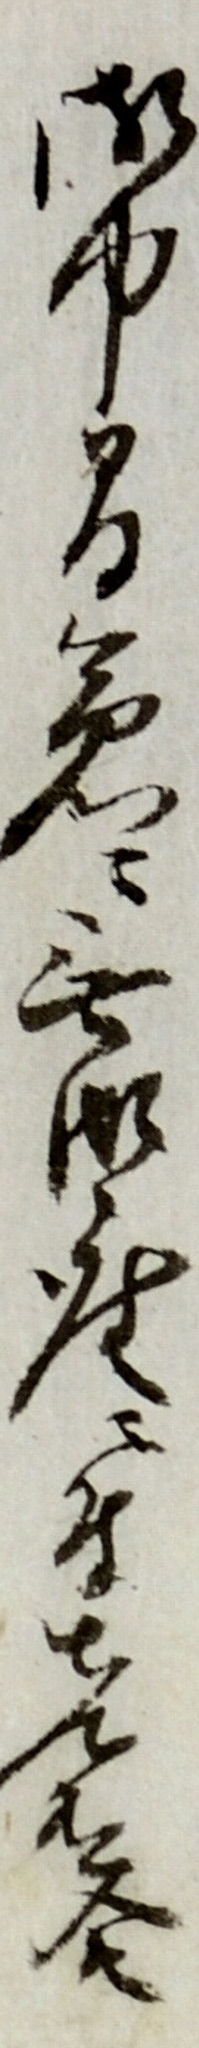御中間急に無御座に付先有合
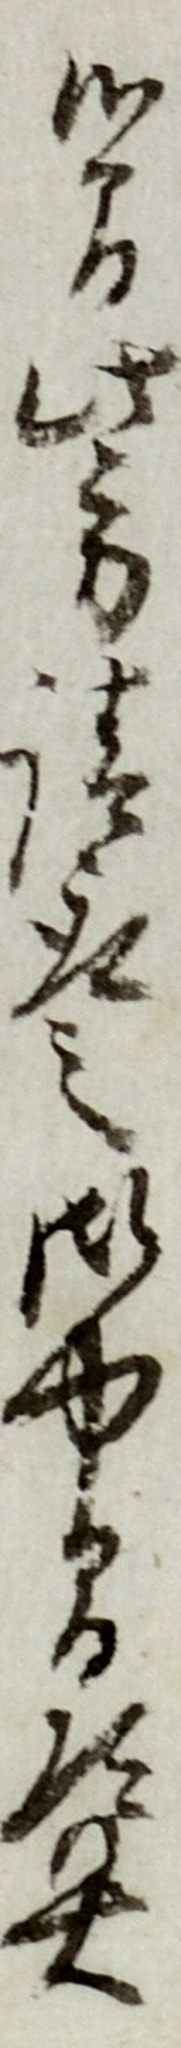候間此方請取之御中間道具
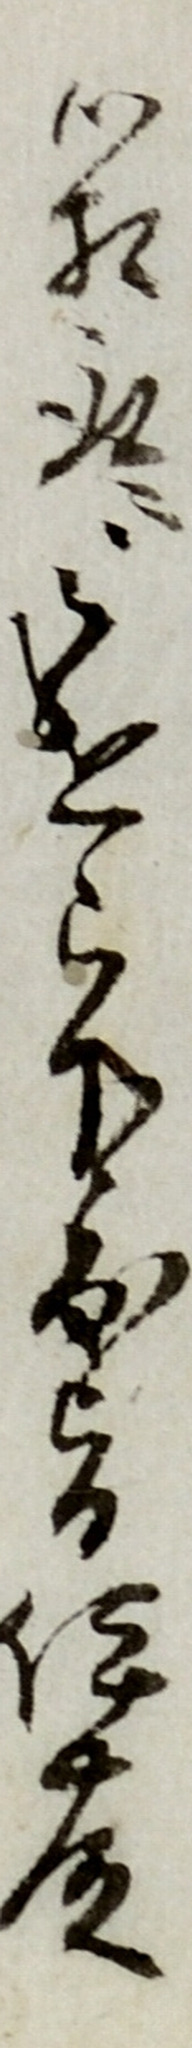箱取に被遣被下度旨伊藤
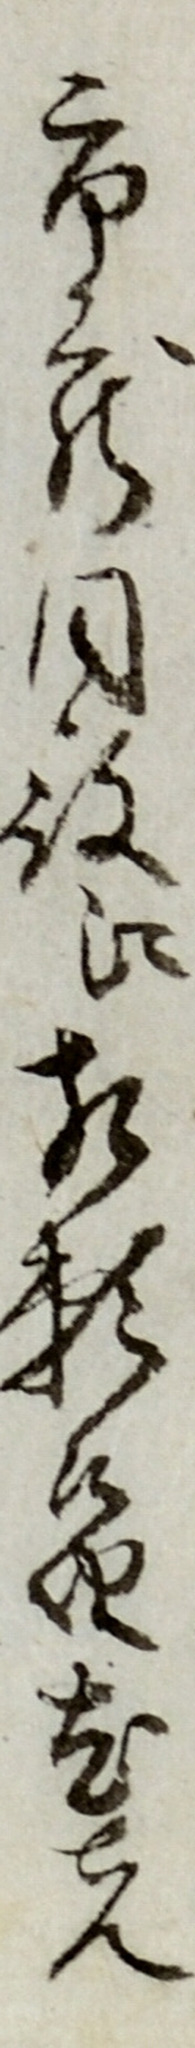市蔵同役え相頼候由尤先
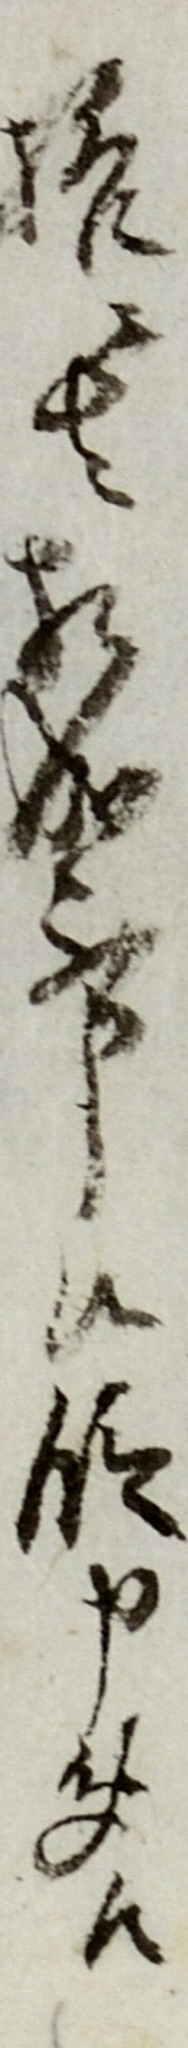格には相成不申候段申聞候
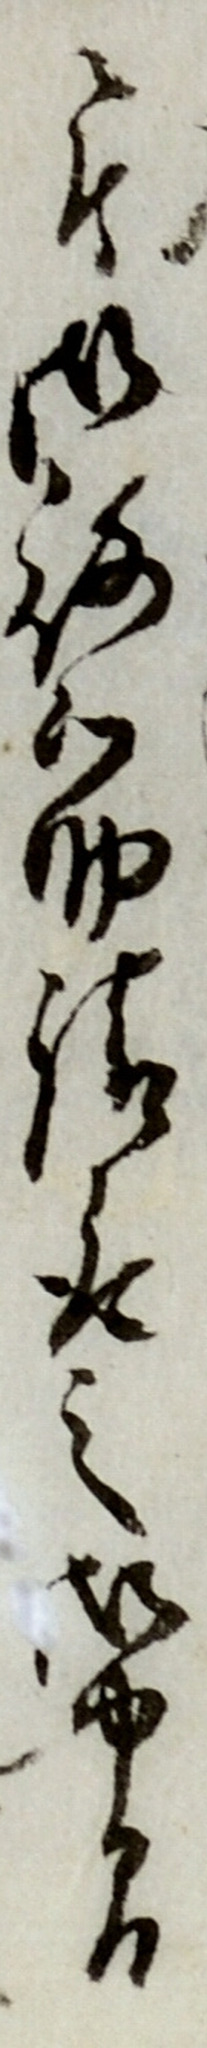に付御役筋請取之御中間
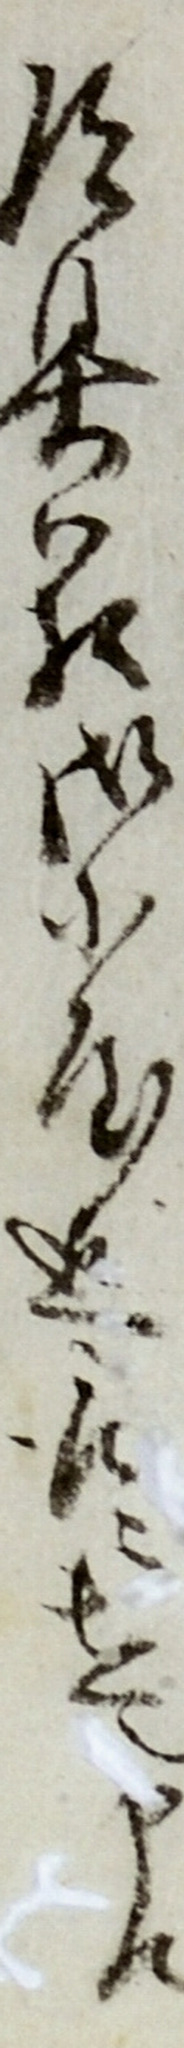道具箱御小屋迄取に遣し申候
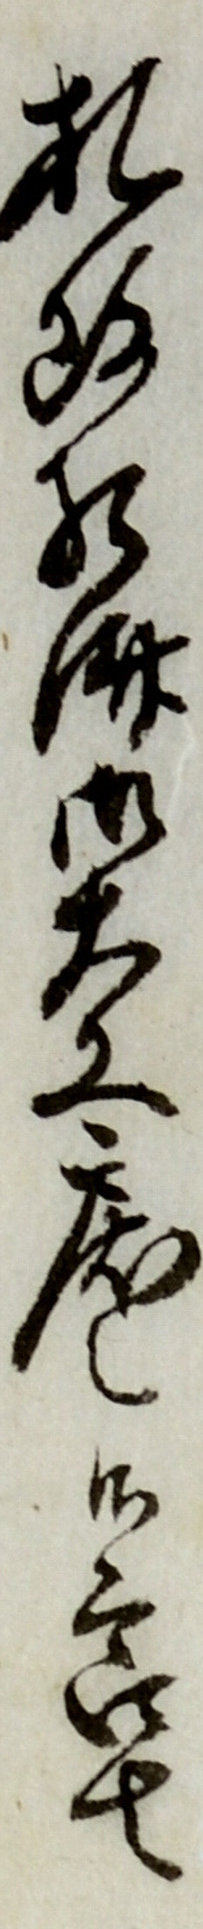札改相済御大工戻し候節は
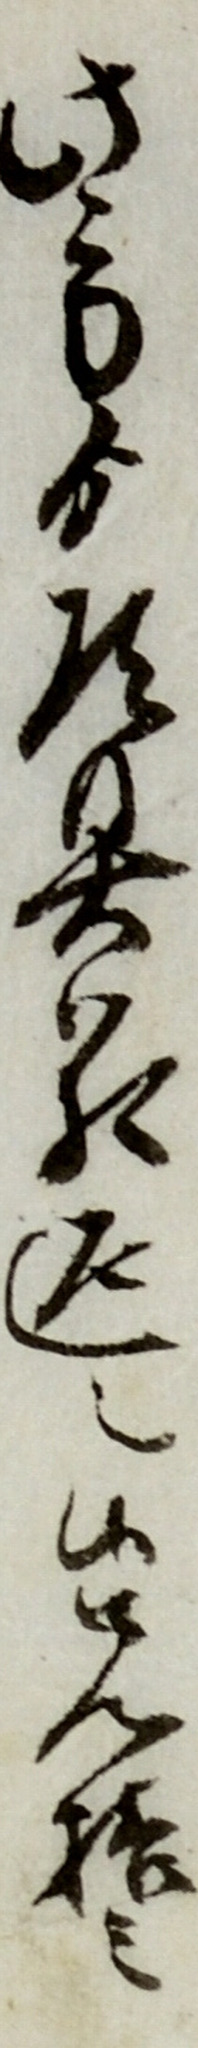此方より道具箱返し候先格之
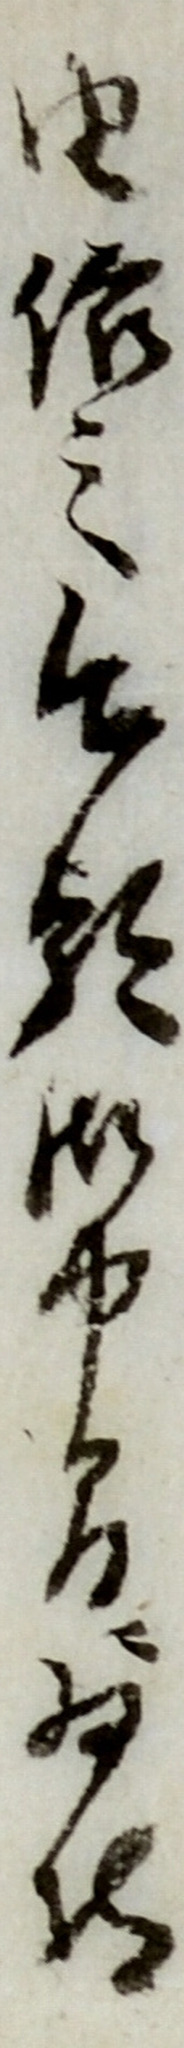由依之今朝御中間に為持
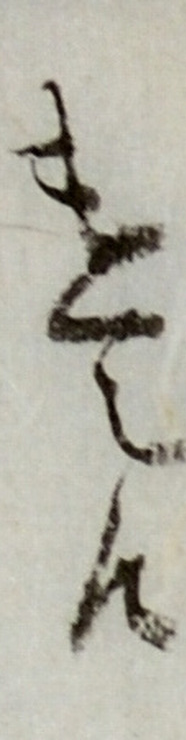遣し候
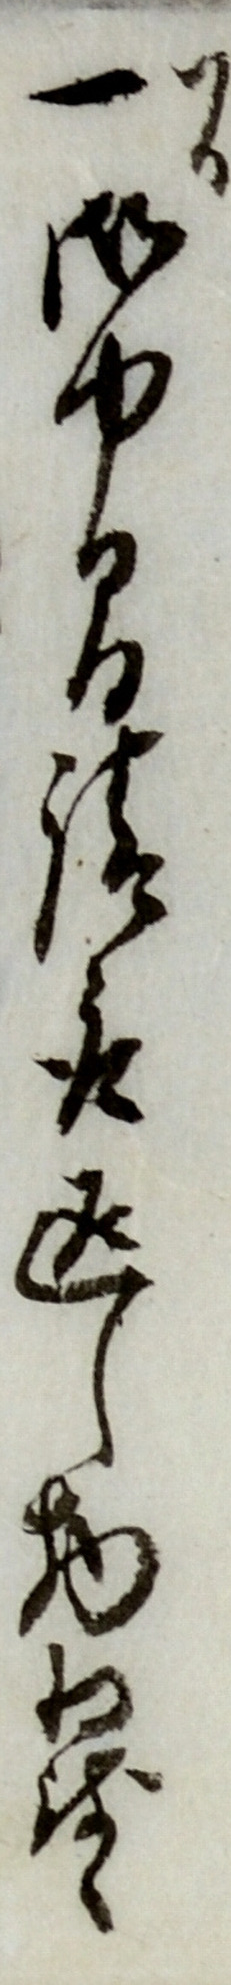一御中間請取返し物為致候
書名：諸事御用留帳
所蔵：伊那市立高遠町図書館・合同会社AMANE
